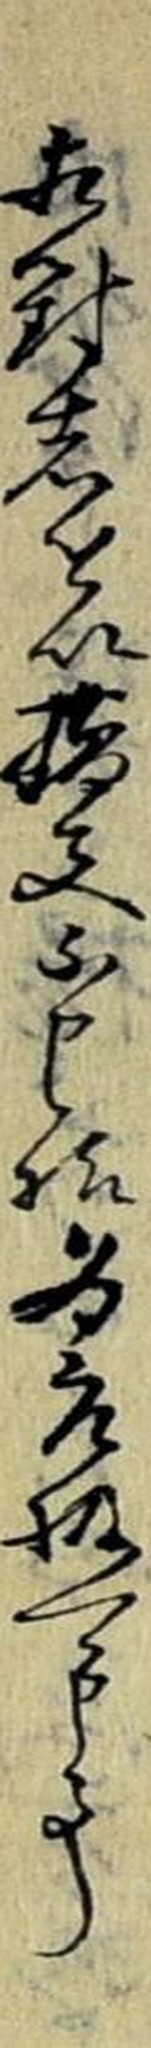相対志を以指支不申様為取扱可申事
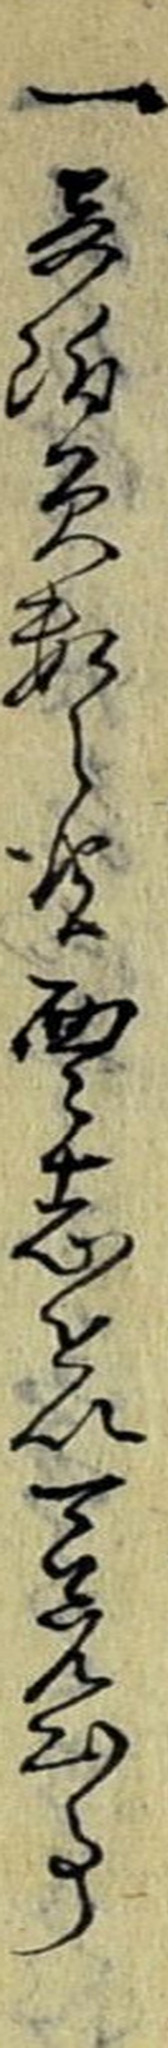一寄附員数之儀は面々志を以可差出事
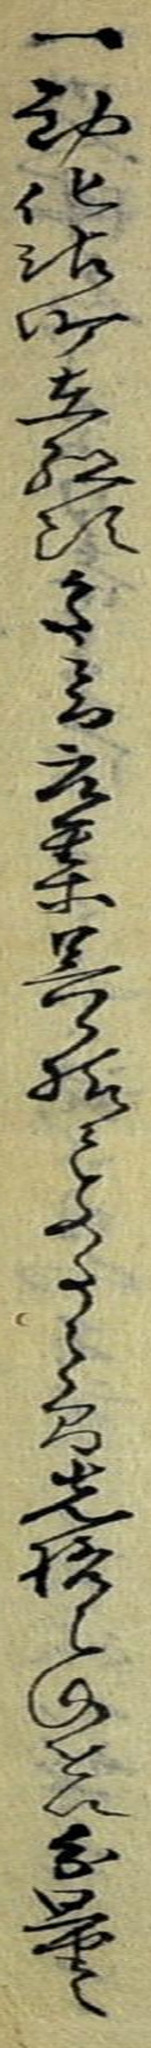一勧化銀町在組頭馬に而取集呉候様にとの事に候間先格之趣を以分量之
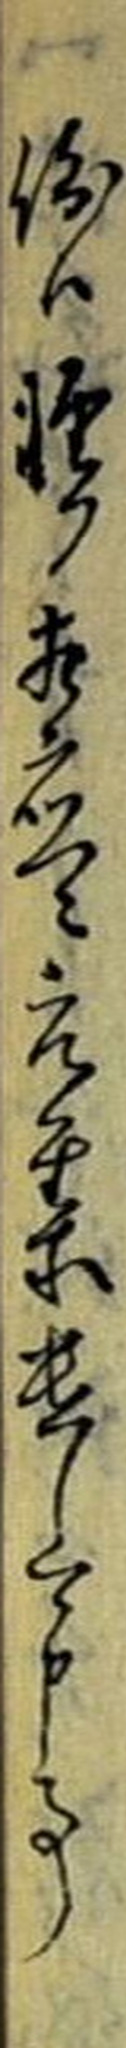儀は軽ク相応に取集遣し可申事
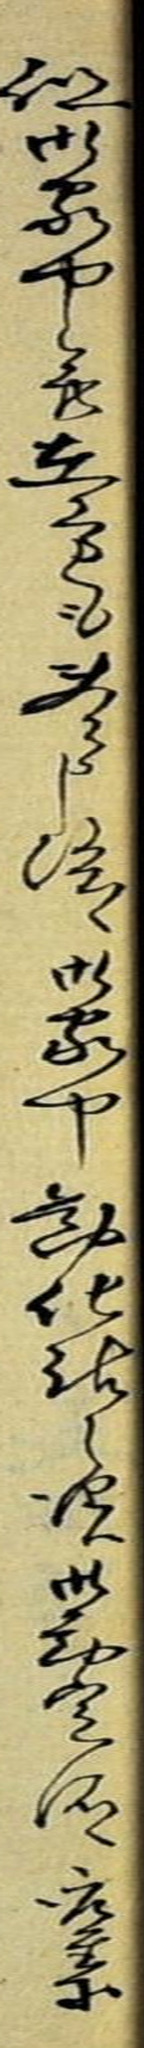但御家中并在方へも夫々申渡候御家中勧化銀之儀は御勘定所へ取集
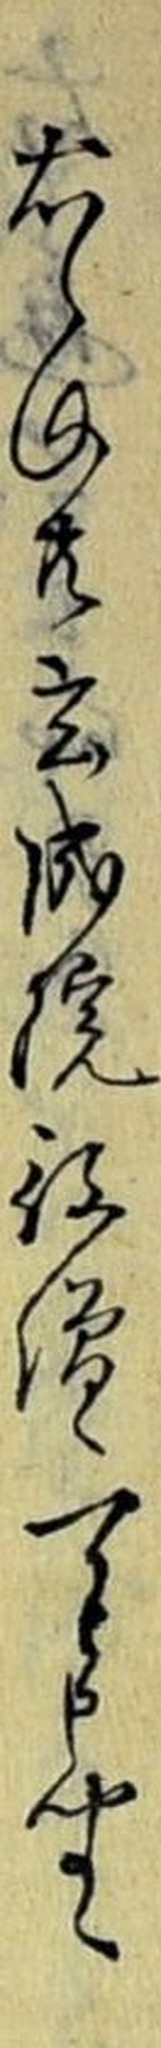右之趣共玄成院役僧へ可被申聞候
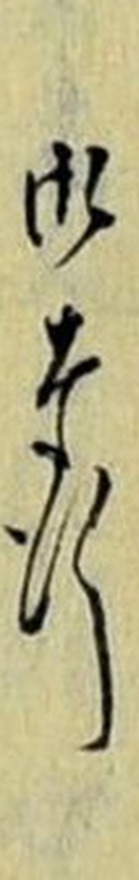御奉行
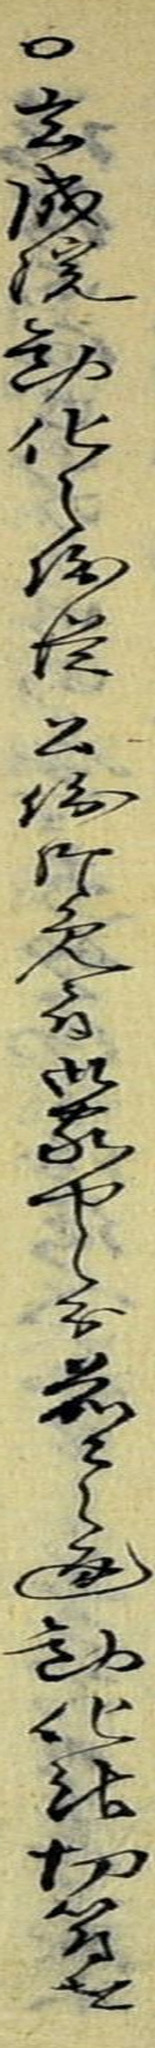○玄成院勧化之儀従公儀御免に付御家中之分前々之通勧化銀切符を
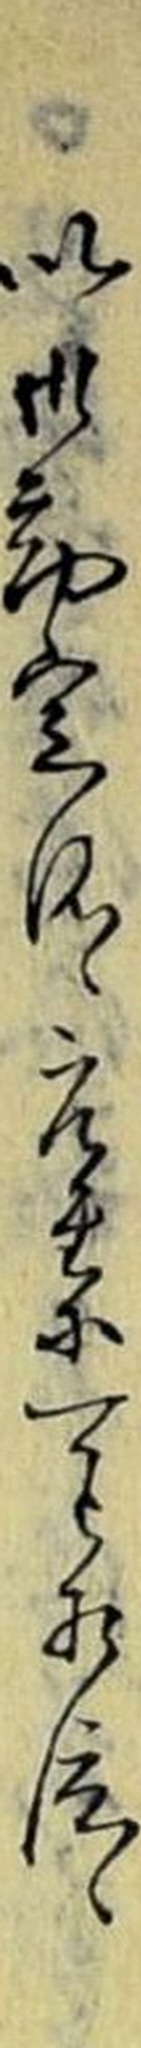以御勘定所へ取集可被相渡候
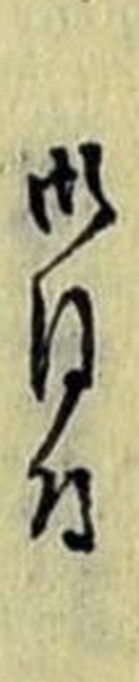御目付
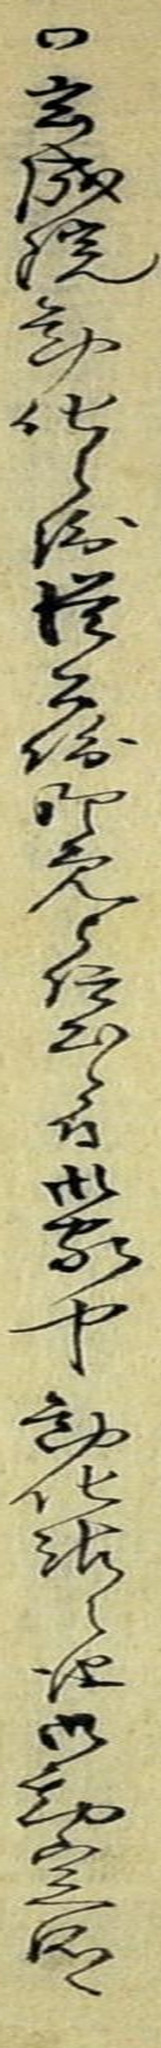○玄成院勧化之儀従公儀御免被仰出候に付御家中勧化銀之儀御勘定所へ
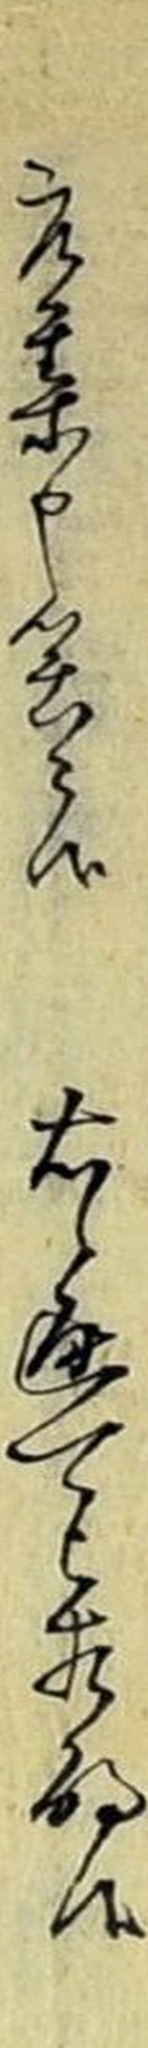取集申筈に候右之通可被相触候
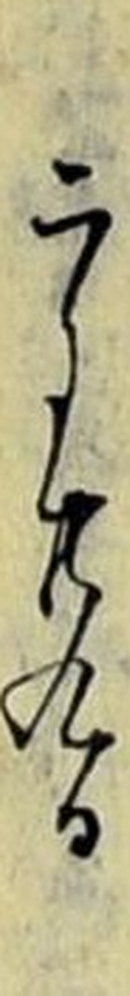二月廿九日
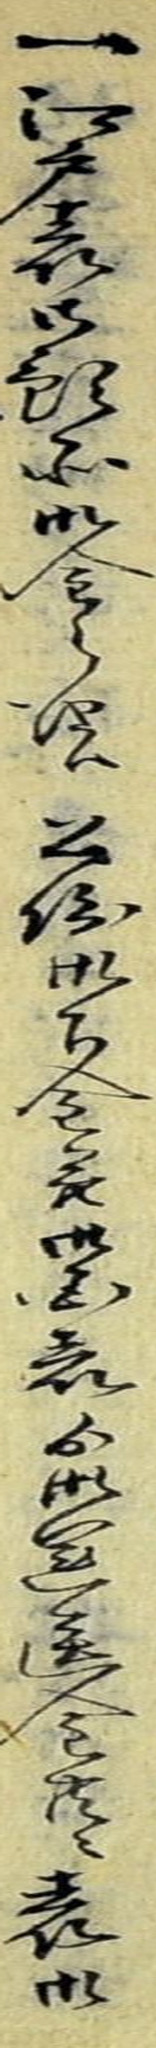一江戸表御預所御金之儀は公儀御下金并御国表ゟ御運送金共に表御
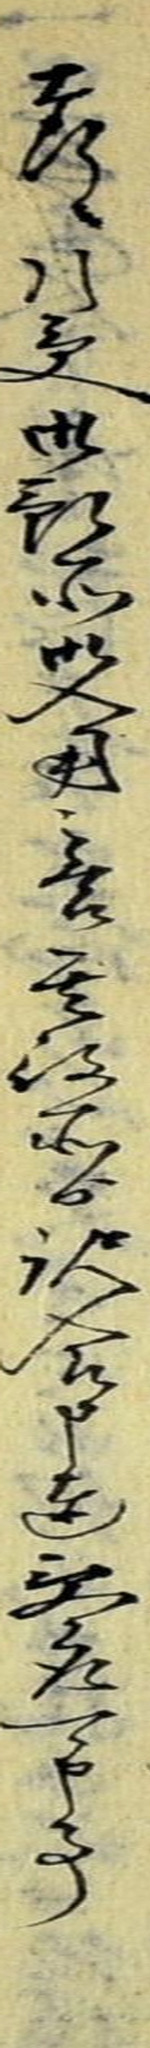奉行へ引受御預所御入用之節其役所ゟ訳合申達受取可申事
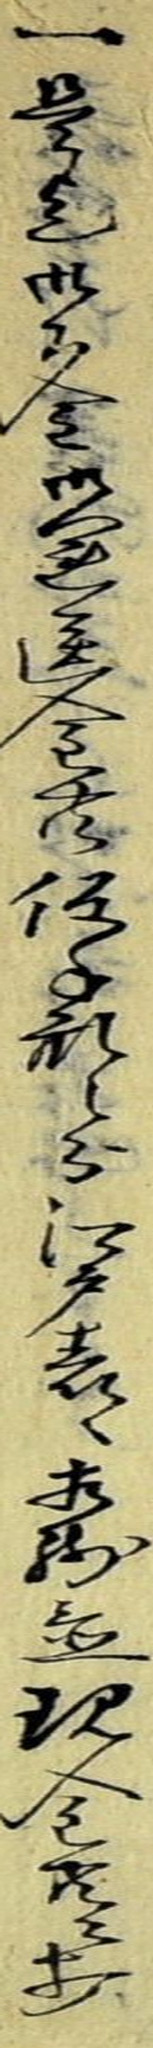一是迄御下金御運送金共仮手形之分江戸表へ相残置現金共に打
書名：命令之部 四
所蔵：福井県文書館 Fukui Prefectural Archives
